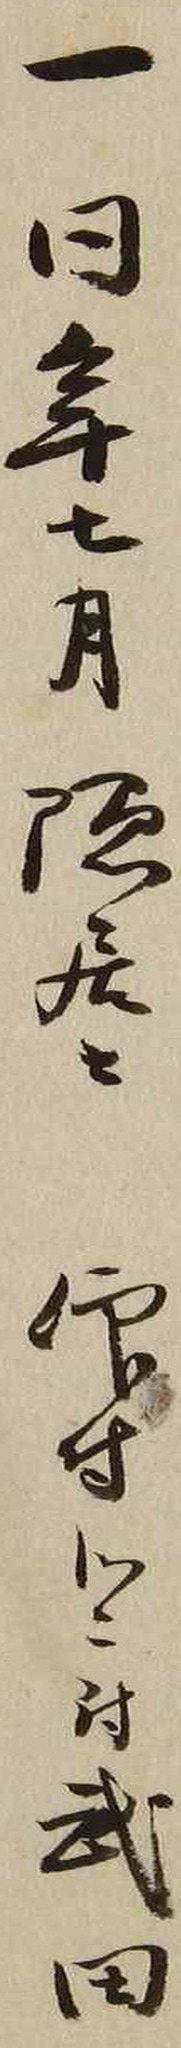一同年七月隠居被仰付候に付武田
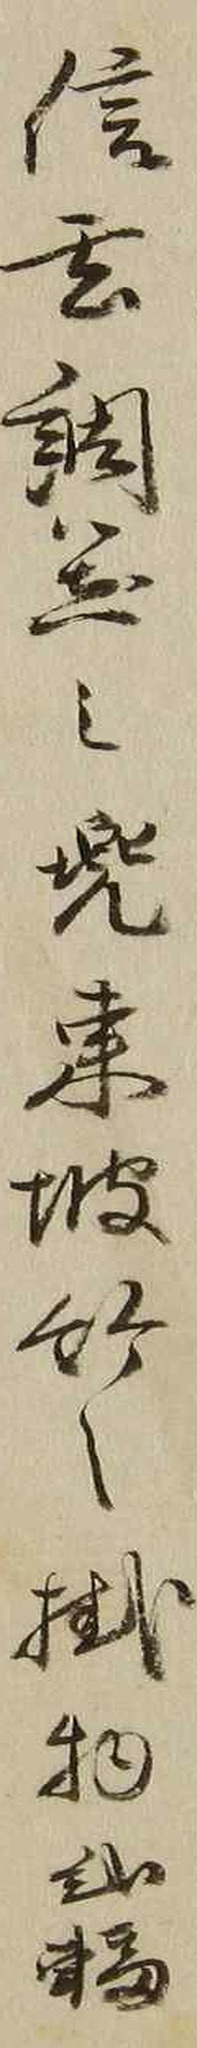信玄調器之兜東坡竹之掛物弐輻
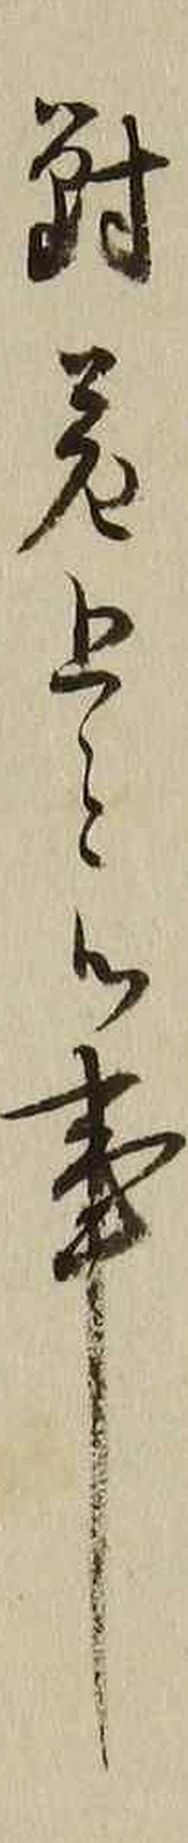対差上之候事
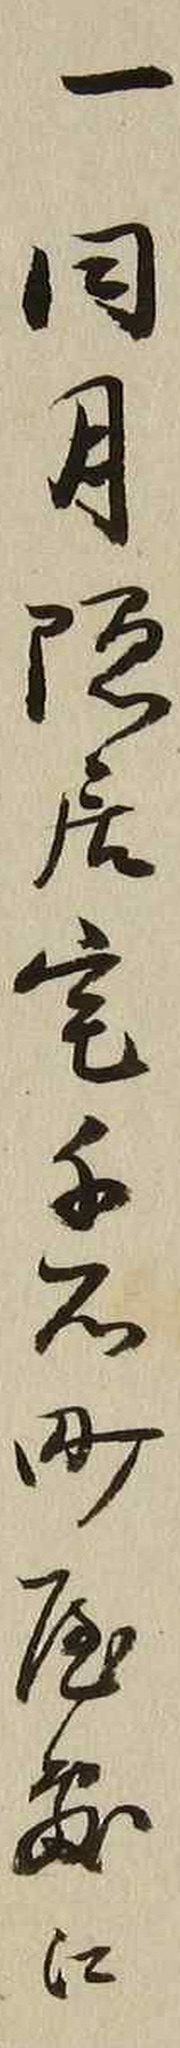一同月隠居宅千石町屋敷江
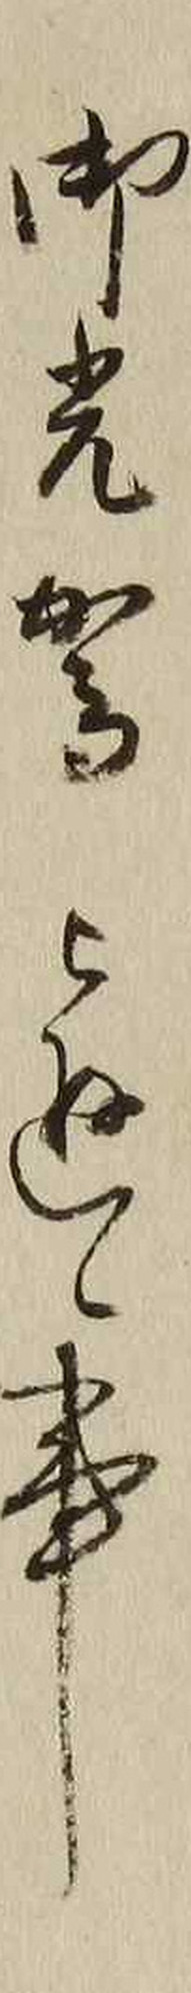御光駕被遊候事
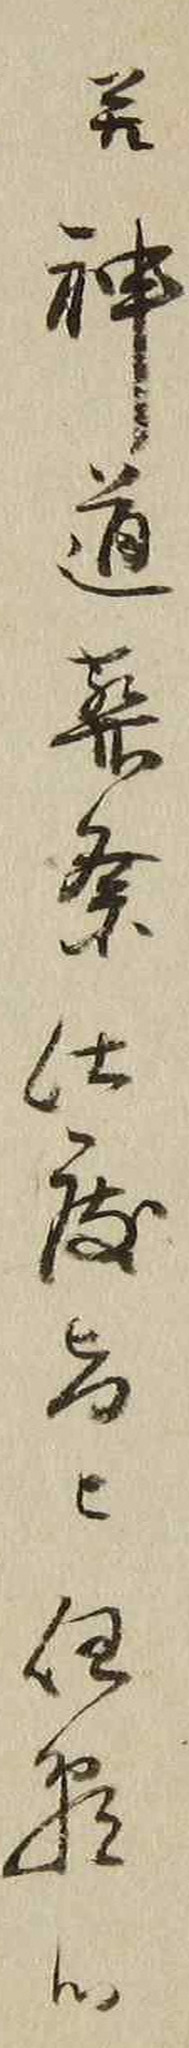并神道葬祭仕度旨被任願候事
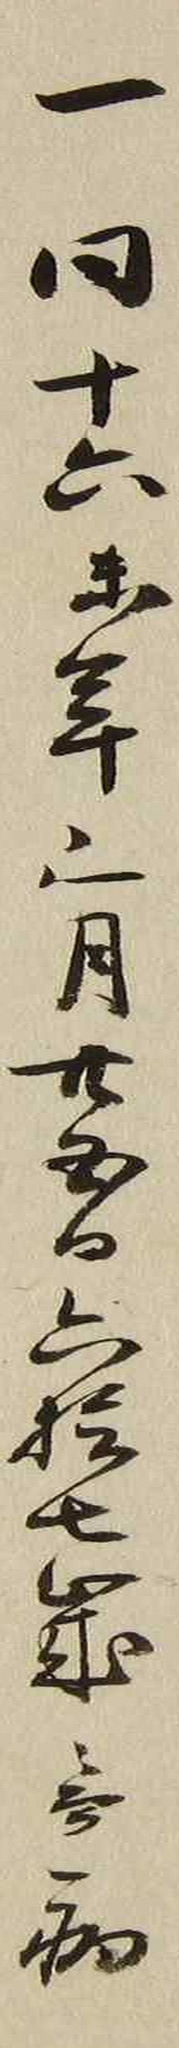一同十六未年三月廿五日六拾七歳に而病
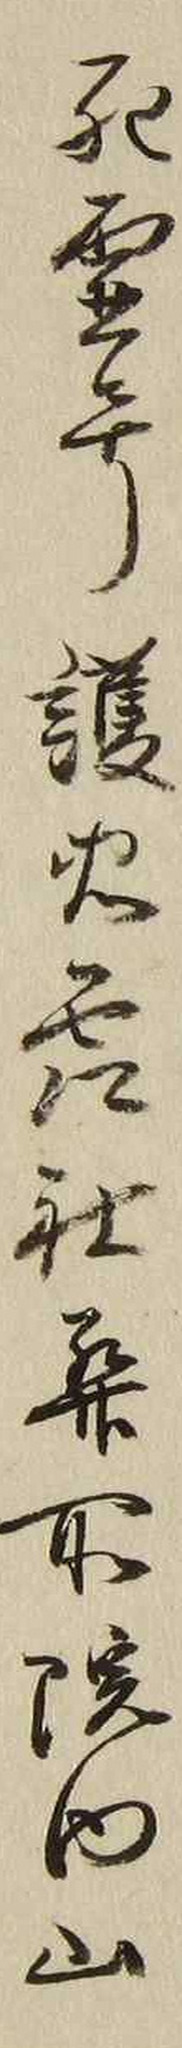死霊号護忠霊社葬所院内山
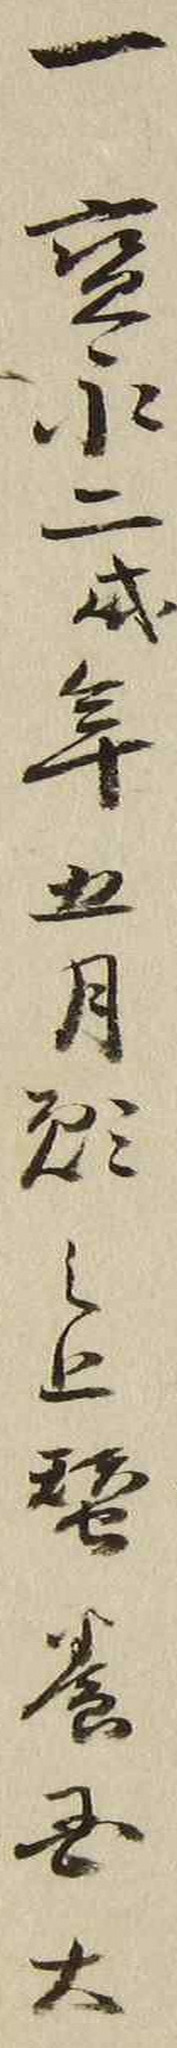一宝永二戌五月願之上蚕養国大
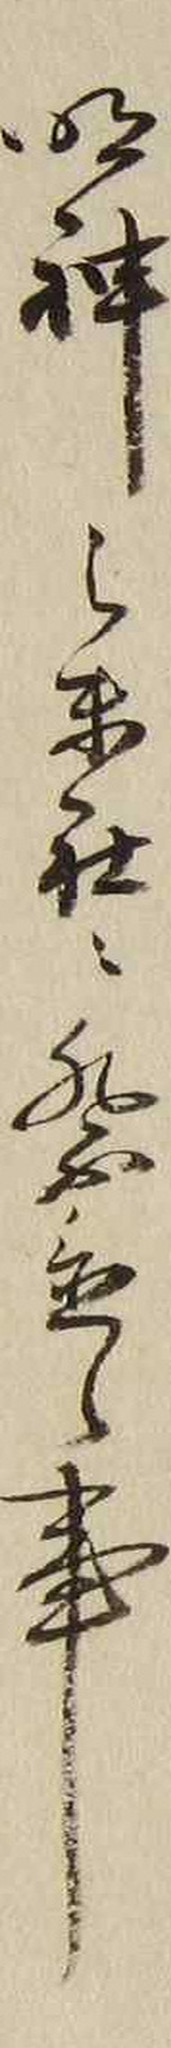明神之末社に祭置候事

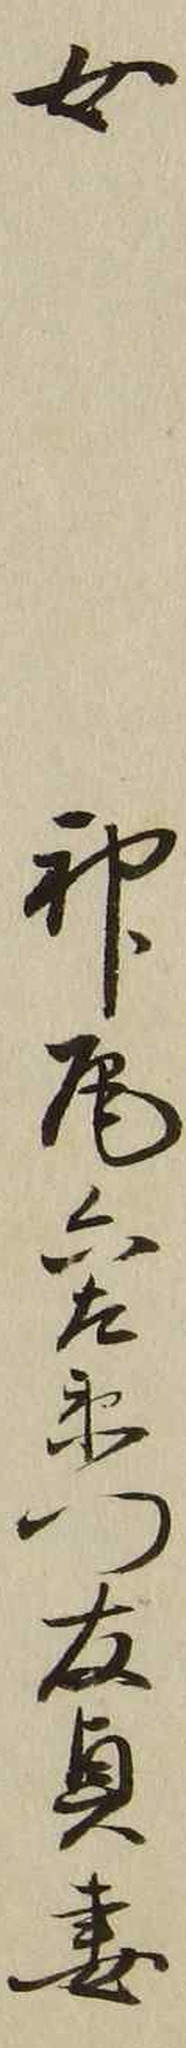女神尾六左衛門友貞妻
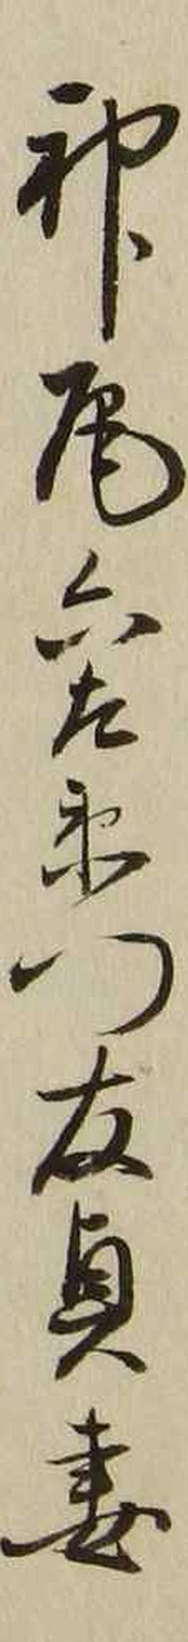女神尾六左衛門友貞妻
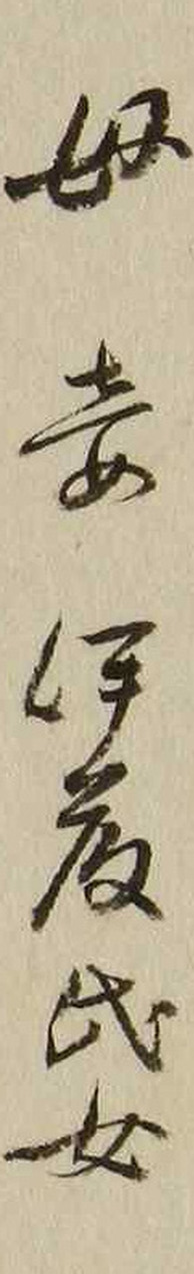母妻伊藤氏女
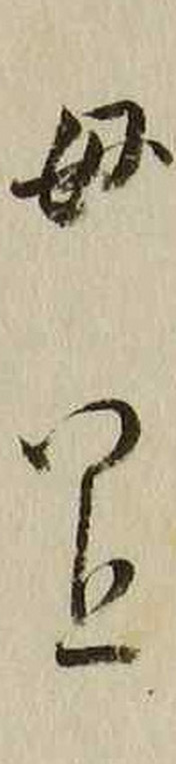母同上
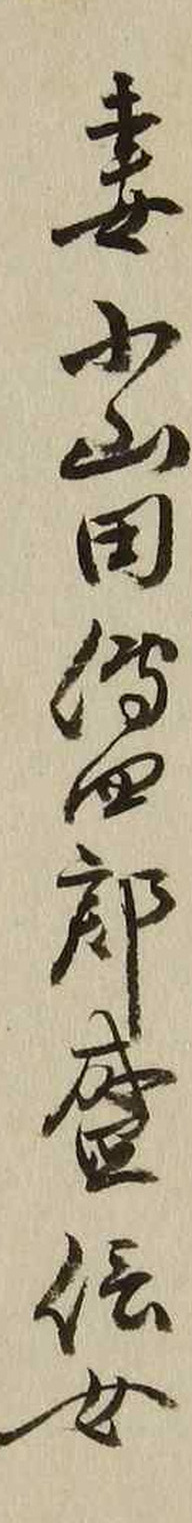妻小山田伝四郎盛信女
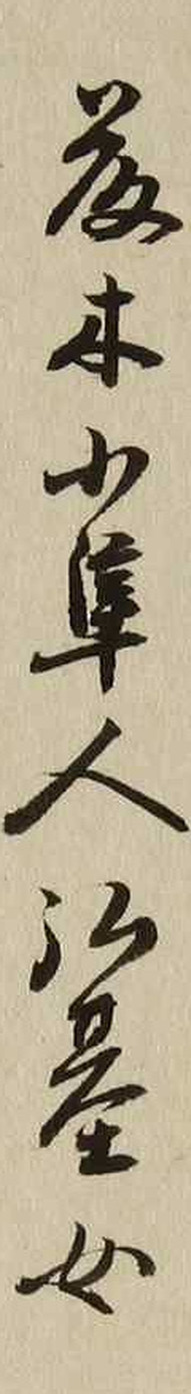藤木小隼人弘基女
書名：諸士系譜　巻之269　さ之部1
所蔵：会津若松市立会津図書館
